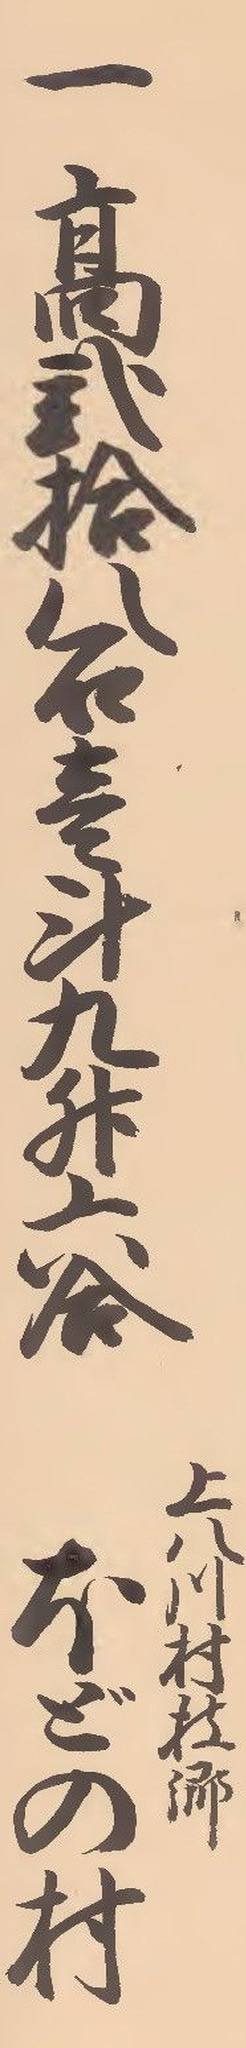一髙弐拾八石壱斗九升六合ほどの村
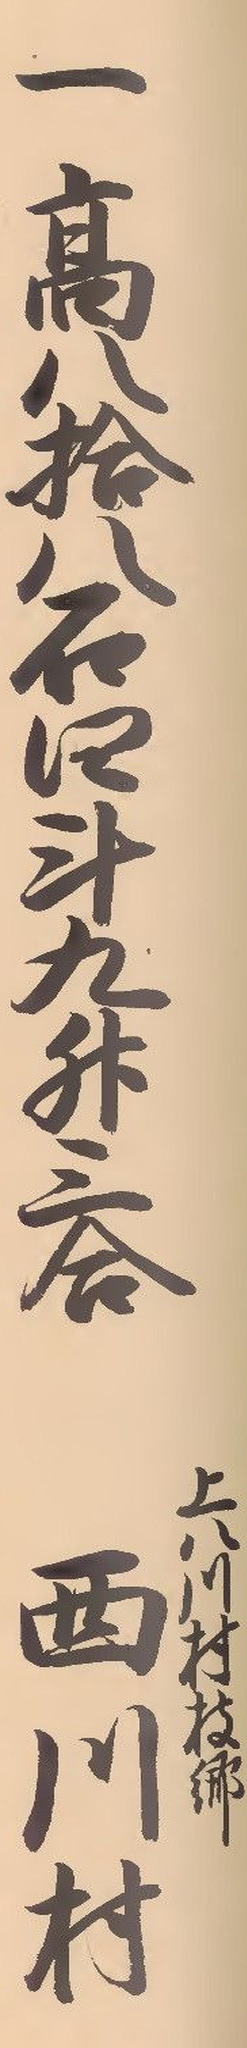一髙八拾八石四斗九升三合西川村
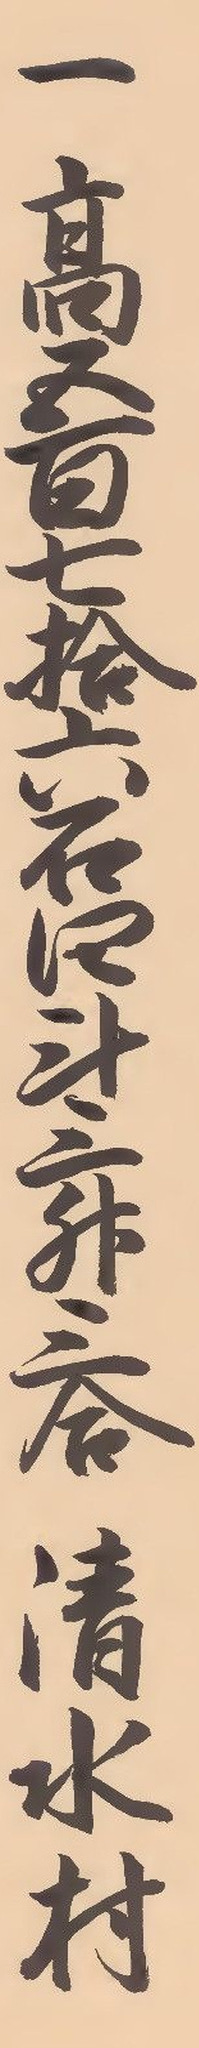一髙五百七拾六石四斗三升三合清水村
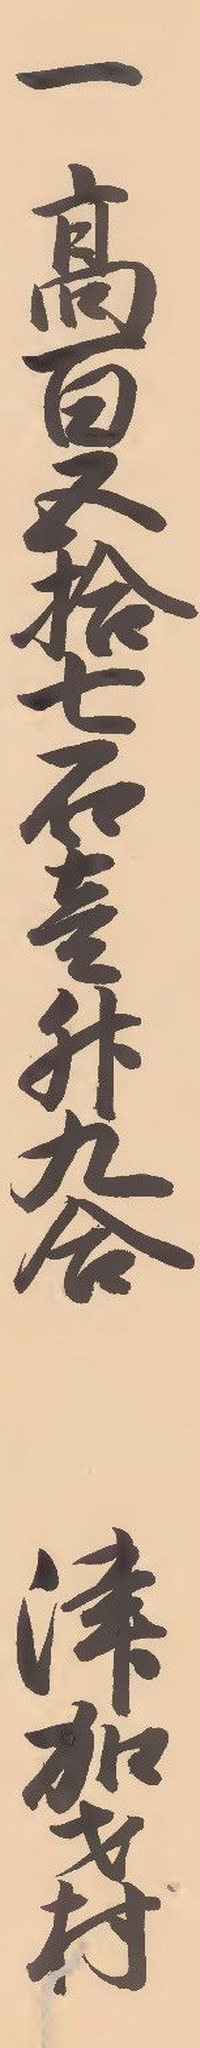一髙百五拾七石壱升九合津加才村
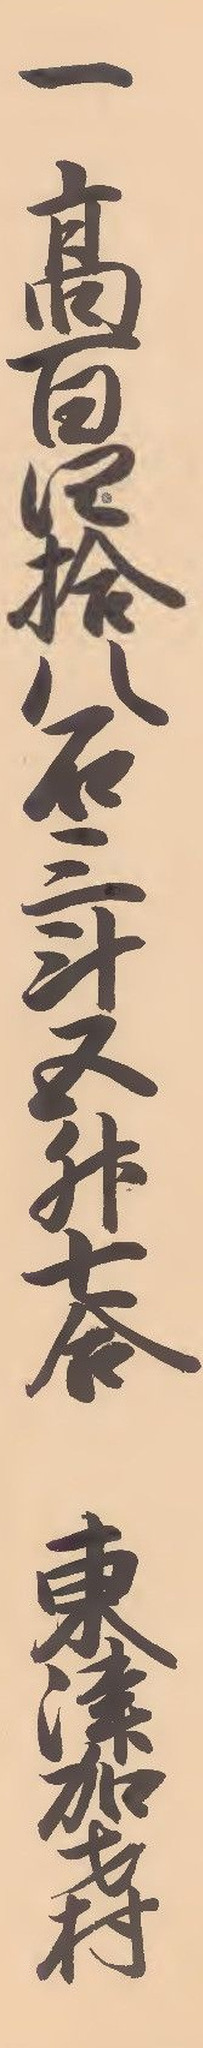一髙百四拾八石三斗五升七合東津加才村

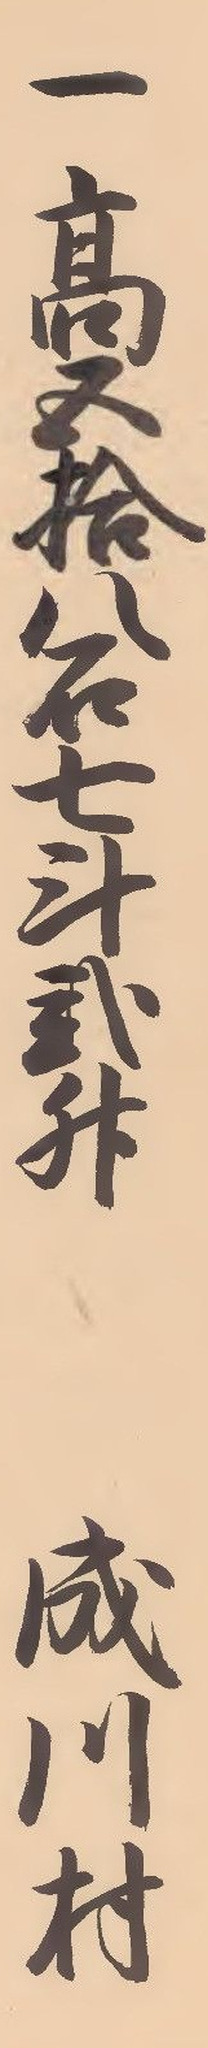一髙五拾八石七斗弐升成川村
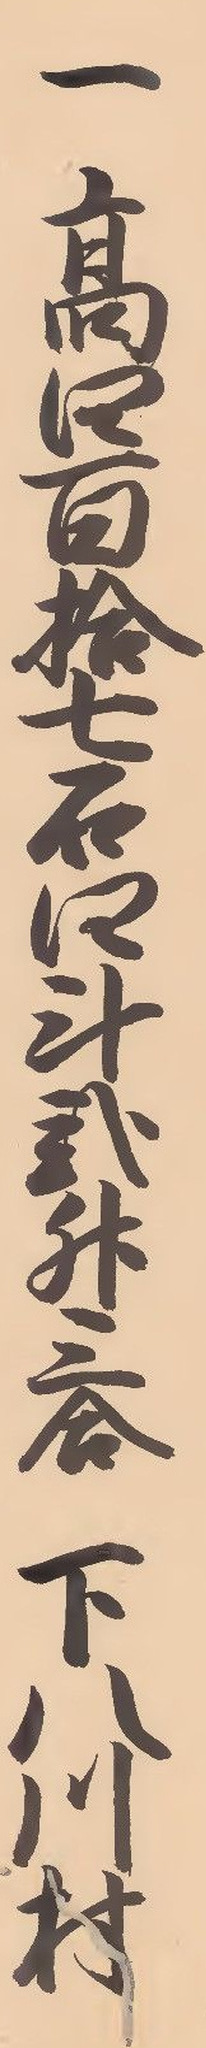一髙四百拾七石四斗弐升三合下八川村
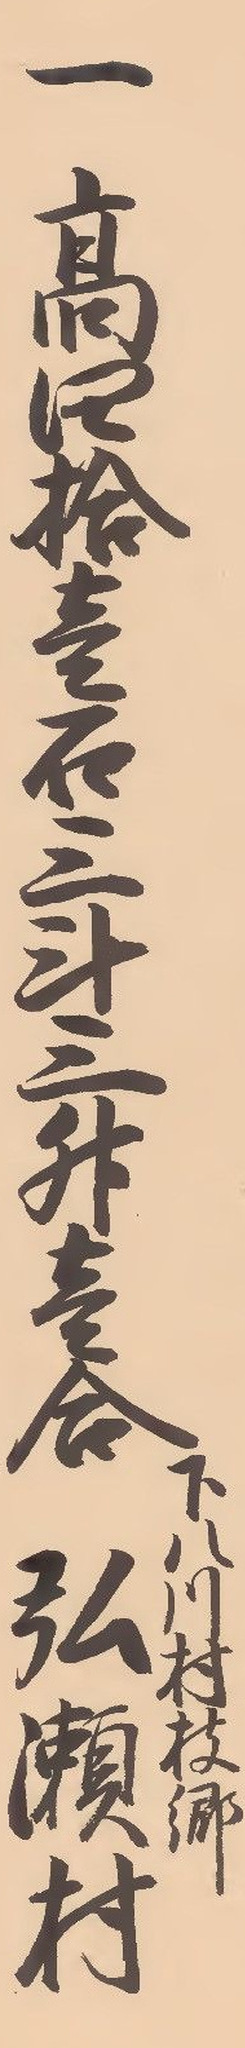一髙四拾壱石三斗三升壱合弘瀬村
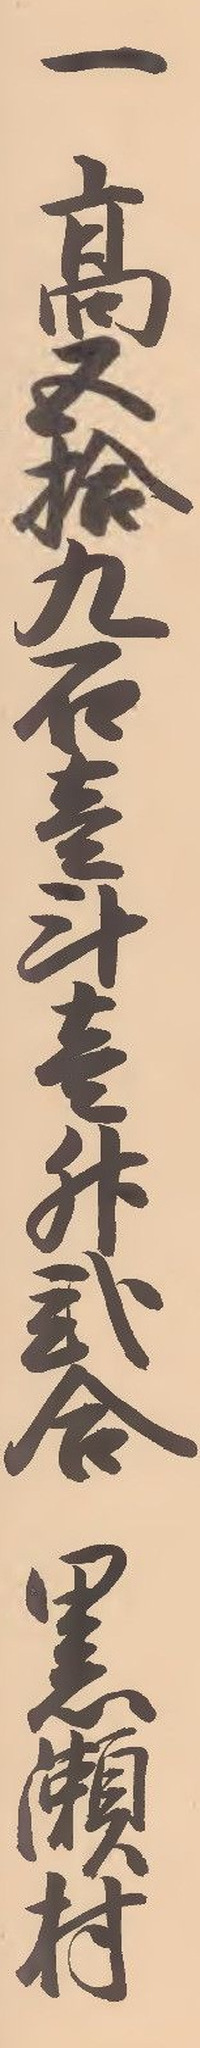一髙五拾九石壱斗壱升弐合黑瀬村
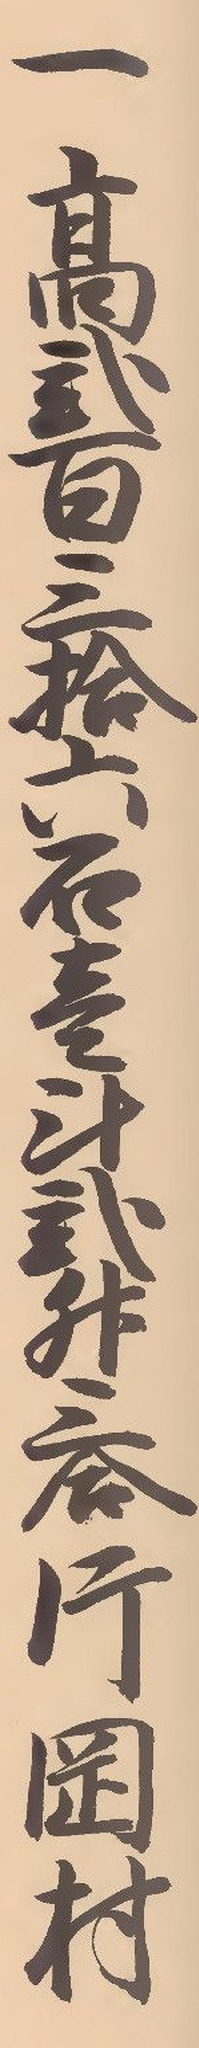一髙弐百三拾六石壱斗弐升三合片岡村
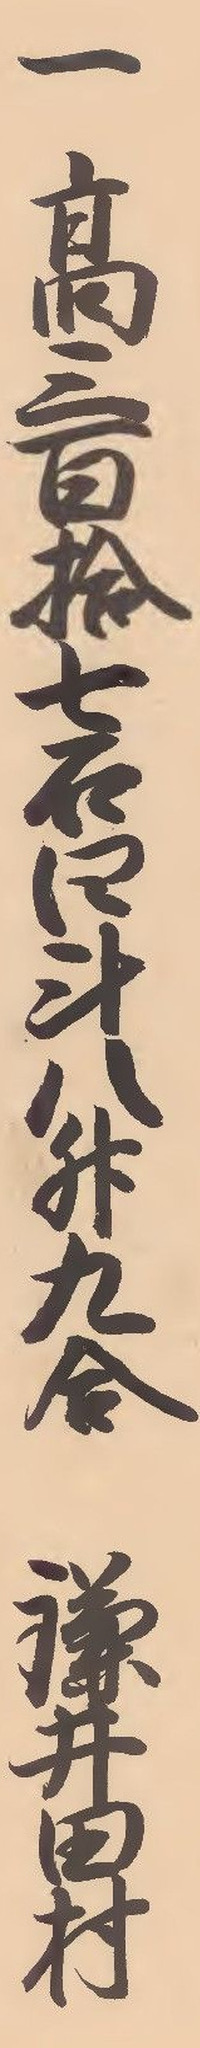一髙三百拾七石四斗八升九合鎌井田村
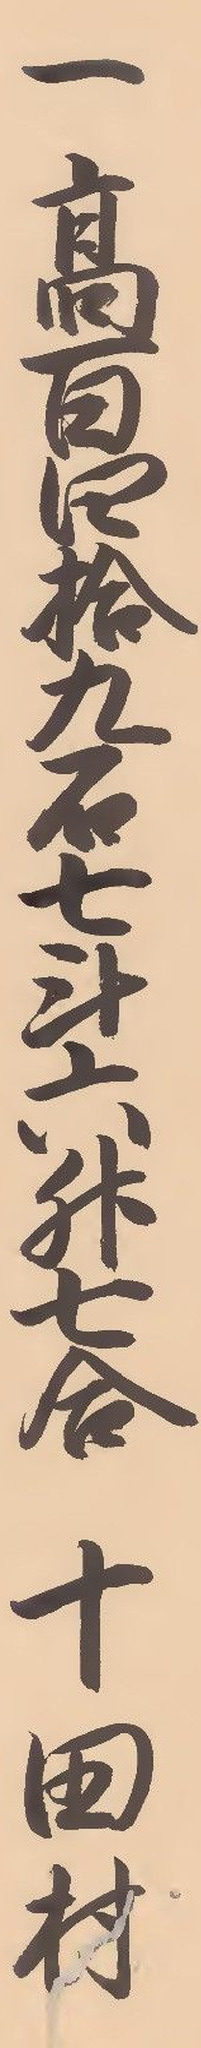一髙百四拾九石七斗六升七合十田村
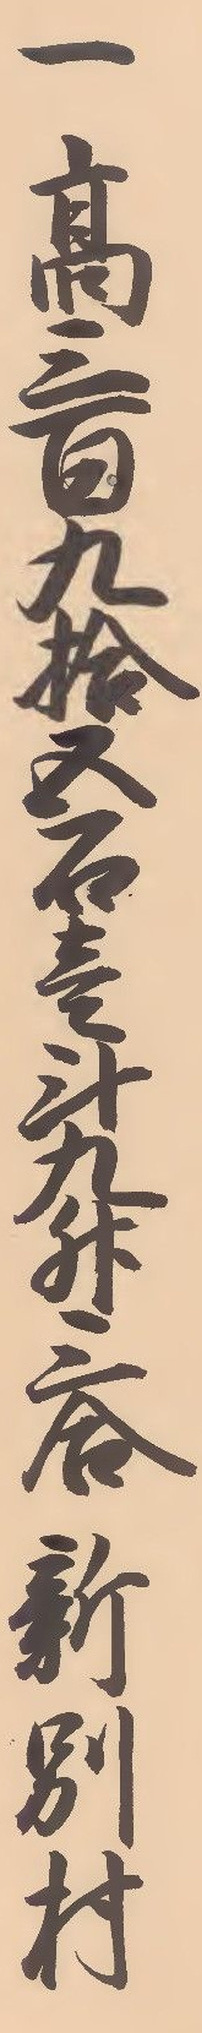一髙三百九拾五石壱斗九升三合新別村

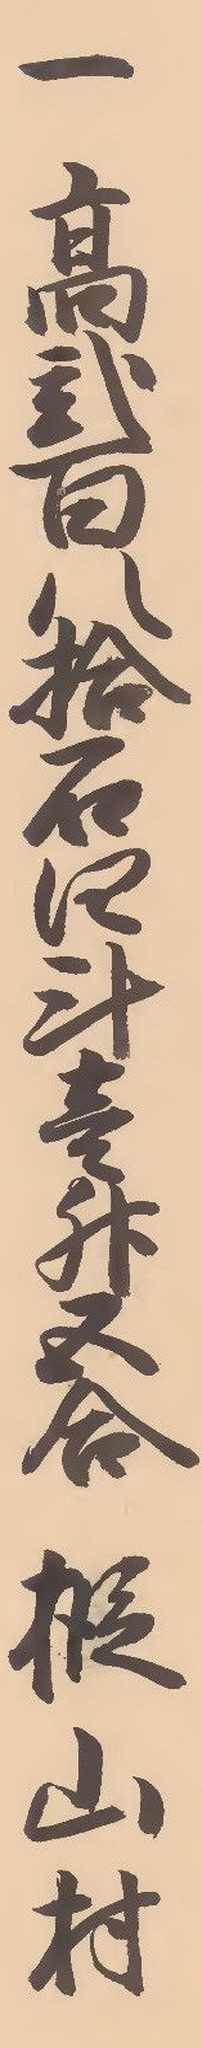一髙弐百八拾石四斗壱升五合山村
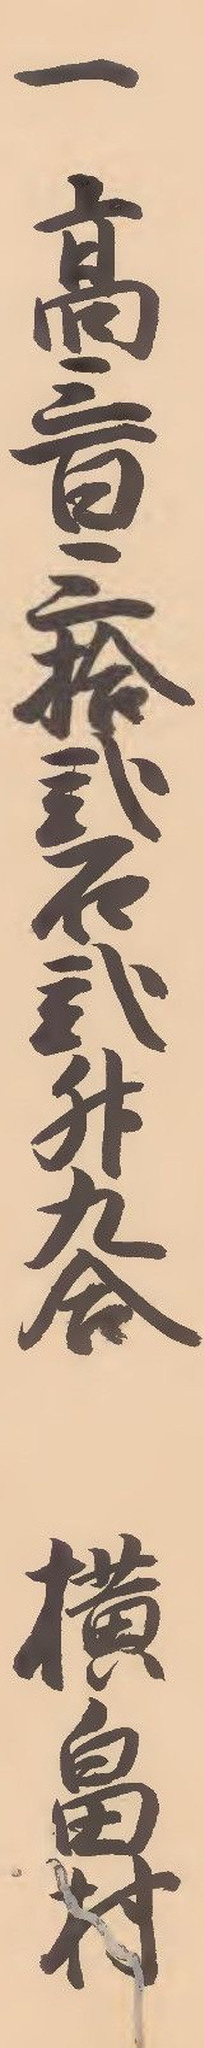一髙三百三拾弐石弐升九合横畠村
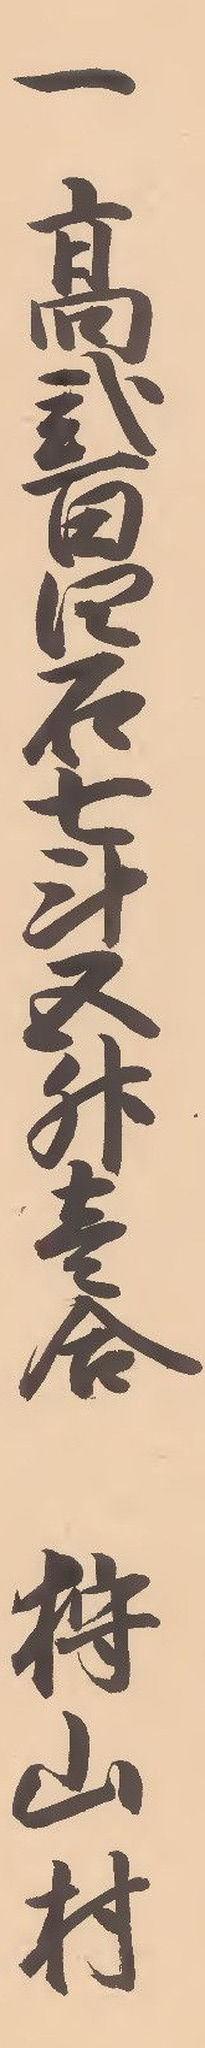一髙弐百四石七斗五升壱合狩山村
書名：土佐国郷帳
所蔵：国立公文書館 National Archives of Japan
